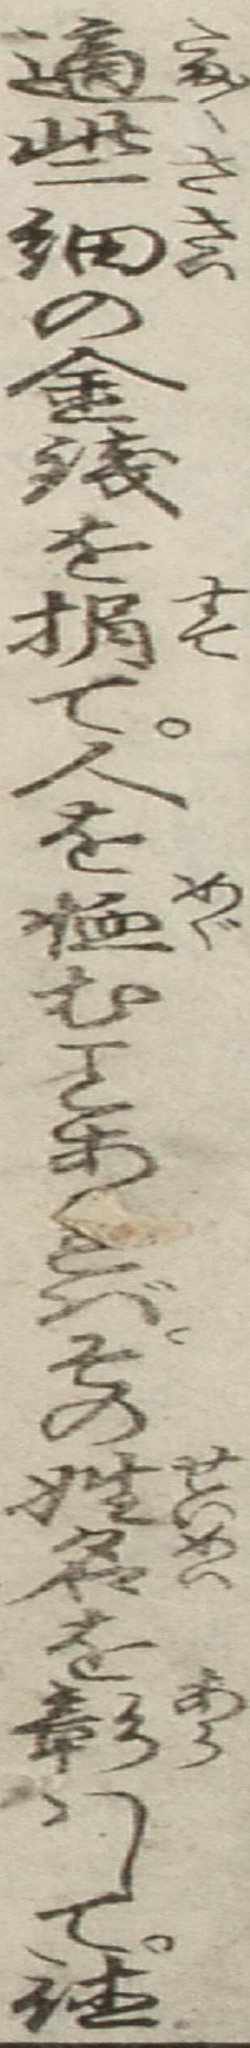適些細の金銭を捐て。人を恤むことあれば。その姓名を顕はして。徳
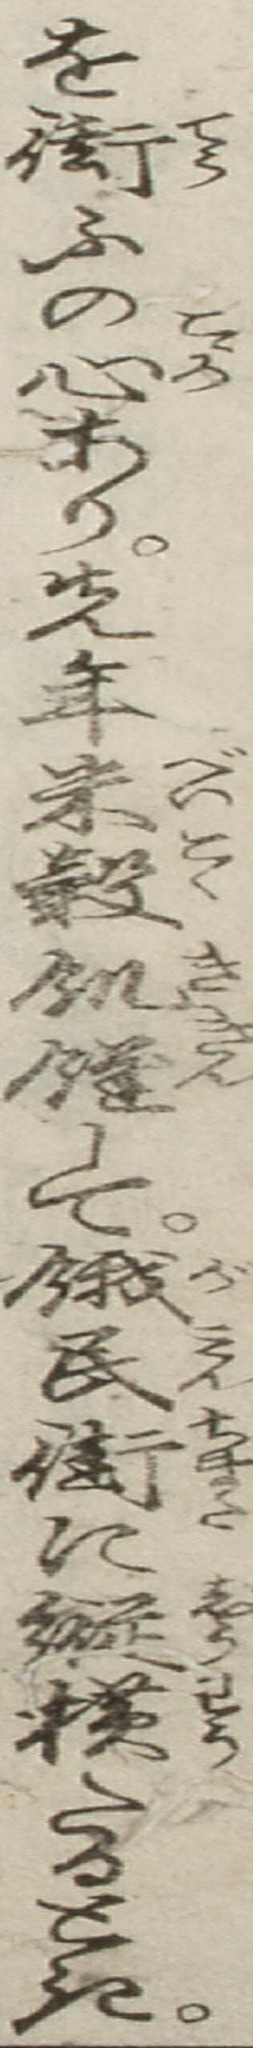を衒ふの心あり。先年米穀飢饉して。餓民街に縦横たるとき。
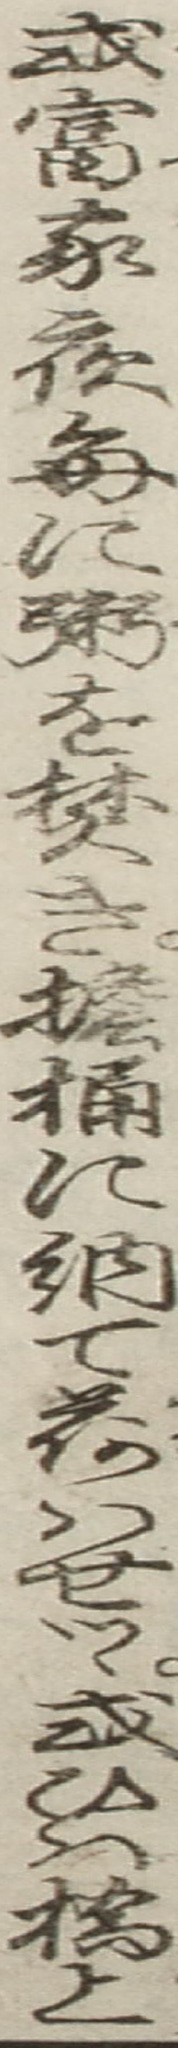或富家夜毎に粥を焚き。擔桶に納て荷はせつゝ。或ひは橋上
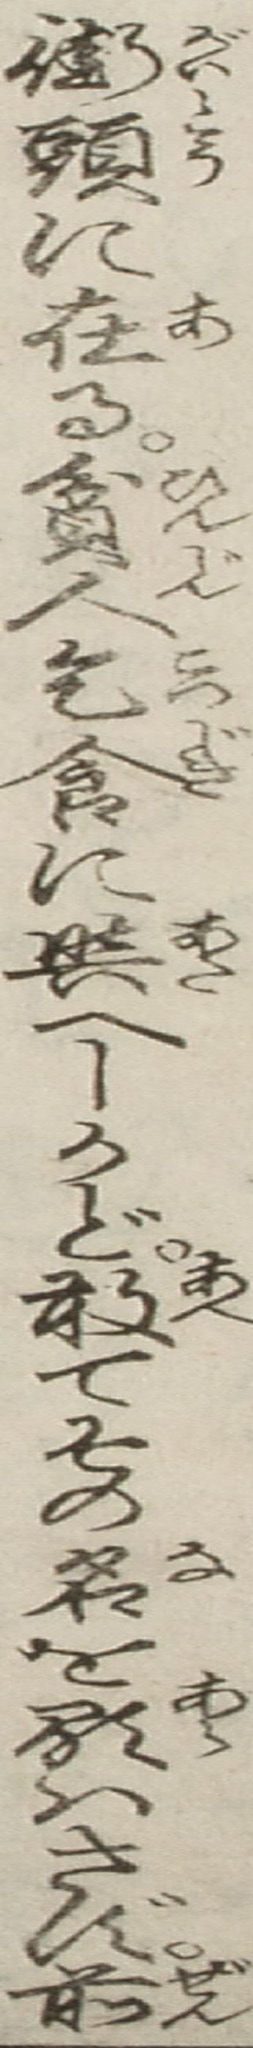街頭に在る。貧人乞食に与へしかど。敢てその名を顕はさず。前
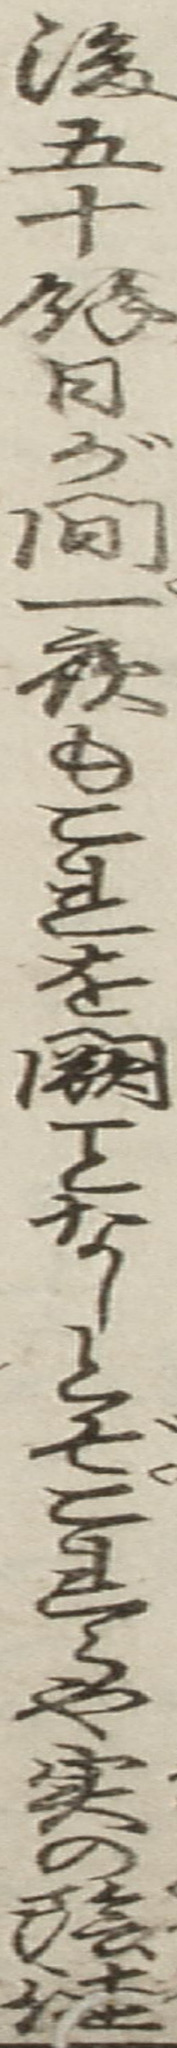後五十餘日が間。一夜もこれを闕ことなしとぞ。これらや実の陰徳
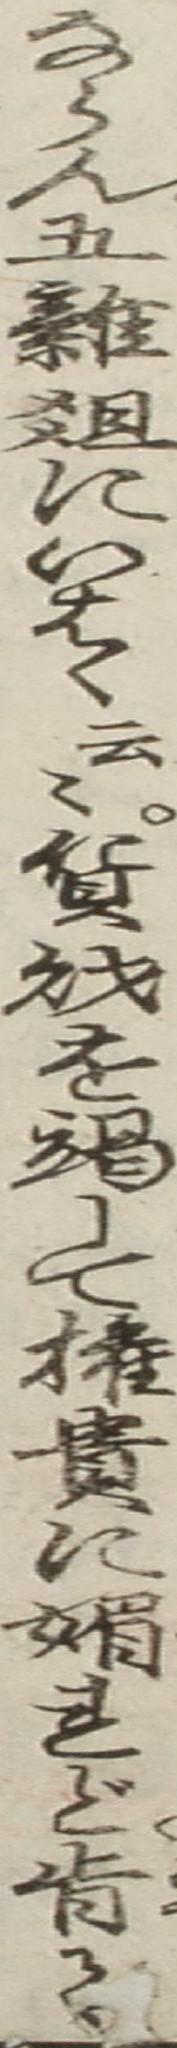ならん。五雑俎にいはく云々。貨財を竭して権貴に媚れど。肯て
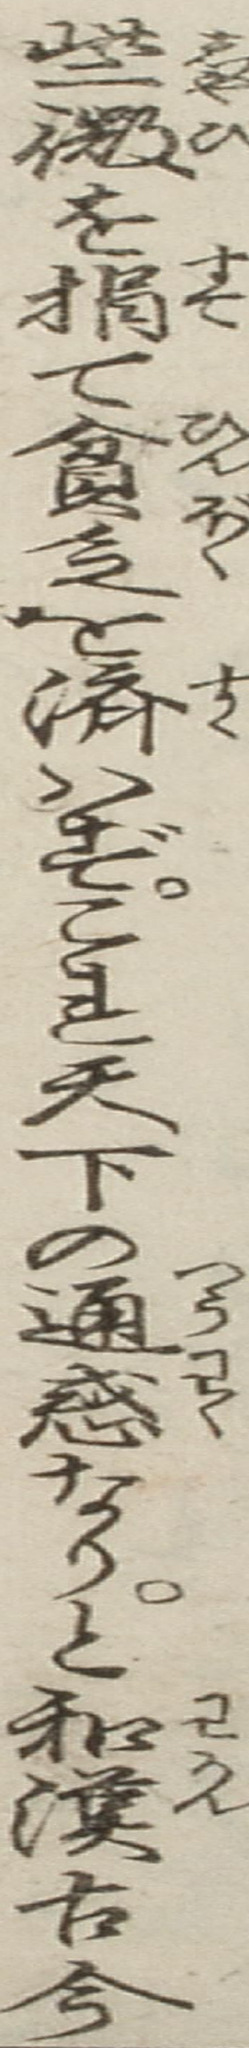些微を捨て貧乏を済はず。これ天下の通惑なり。と和漢古今
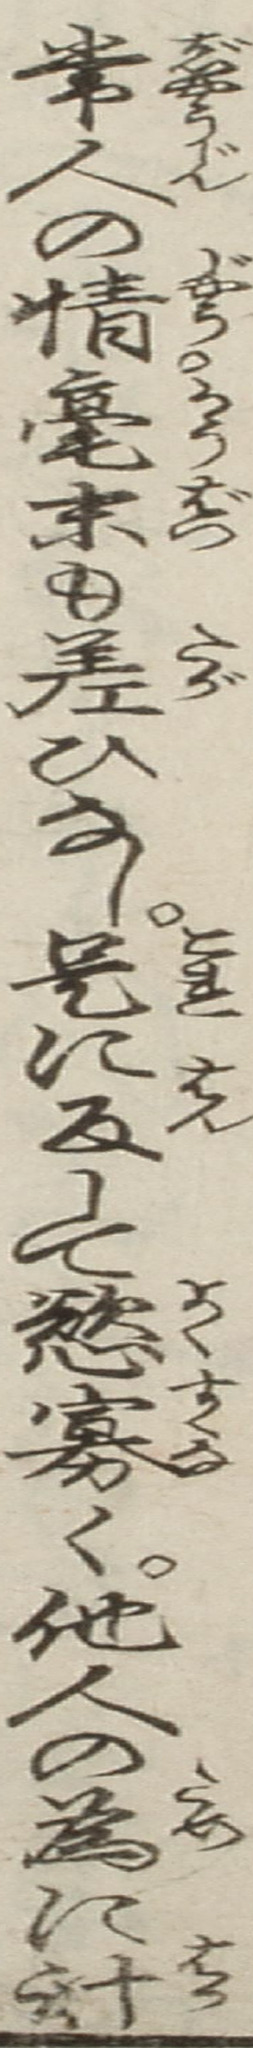常人の情。毫末も差ひなし。是に反して慾寡く。他人の為に計
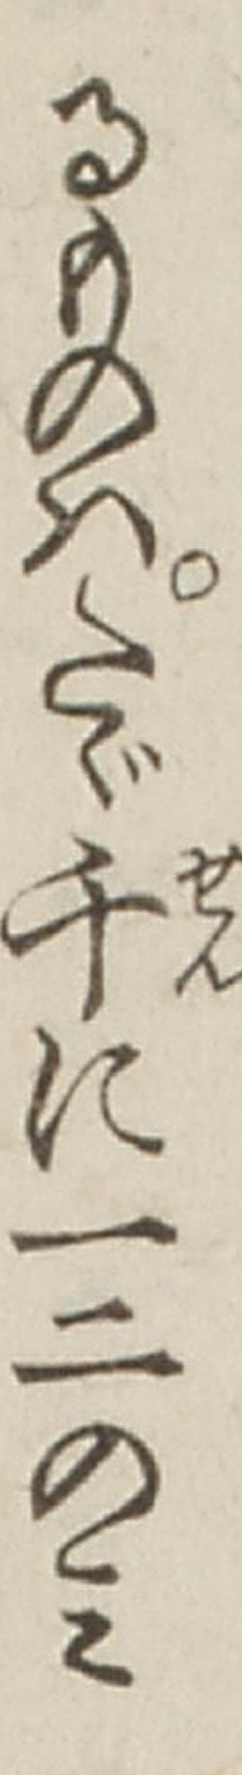るものは。たゞ千に一二のみ
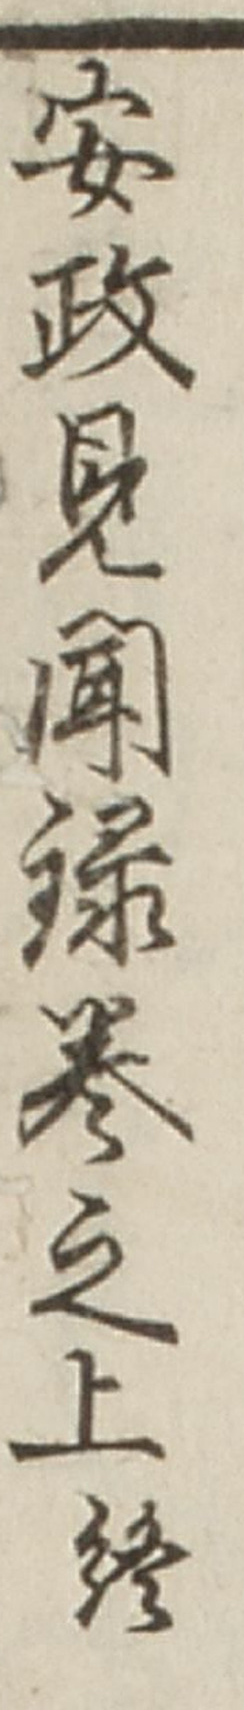安政見聞録巻之上終
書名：安政見聞録　上
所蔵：東京大学地震研究所図書室 Earthquake Research Institute Library, The University of Tokyo, JAPAN
